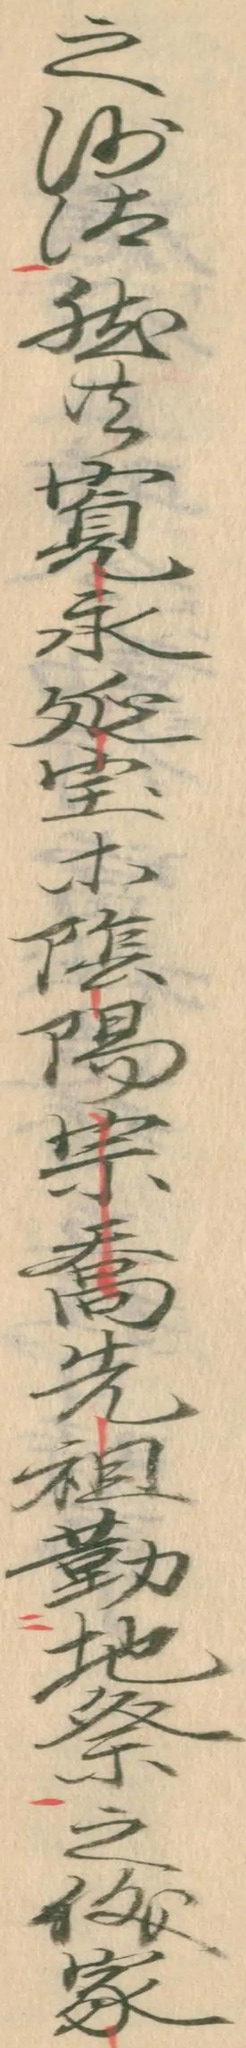之沙汰然共寛-永延-宝等陰-陽宗喬先-祖勤地祭之儀家-
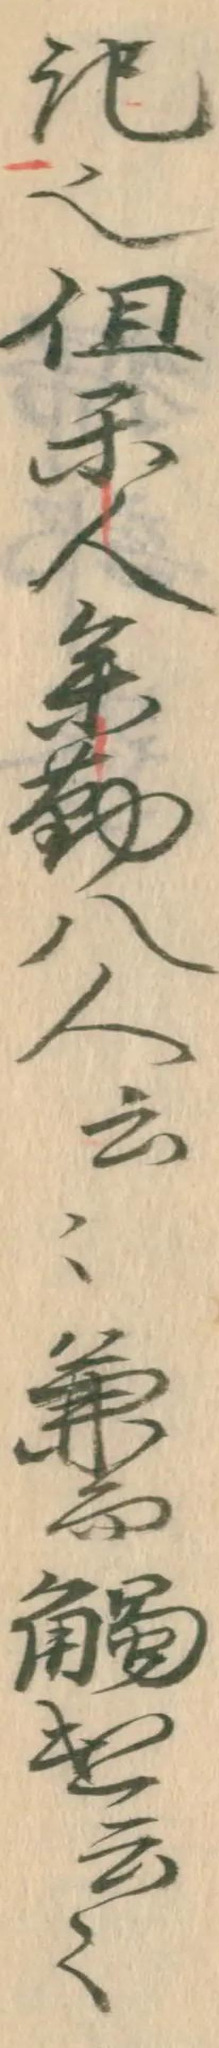記也但楽-人参-勤八人云々兼而触遣云々
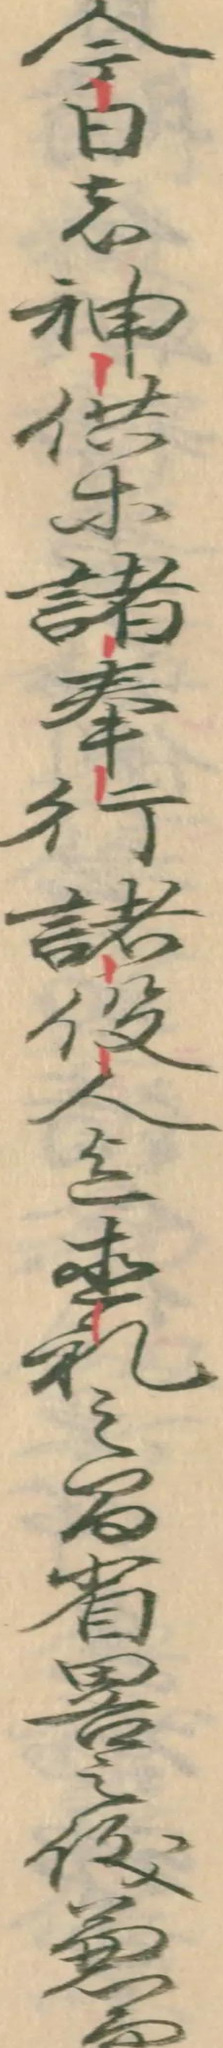今-日者神-供等諸-奉-行諸-役-人迄直-礼之間省略之儀兼而
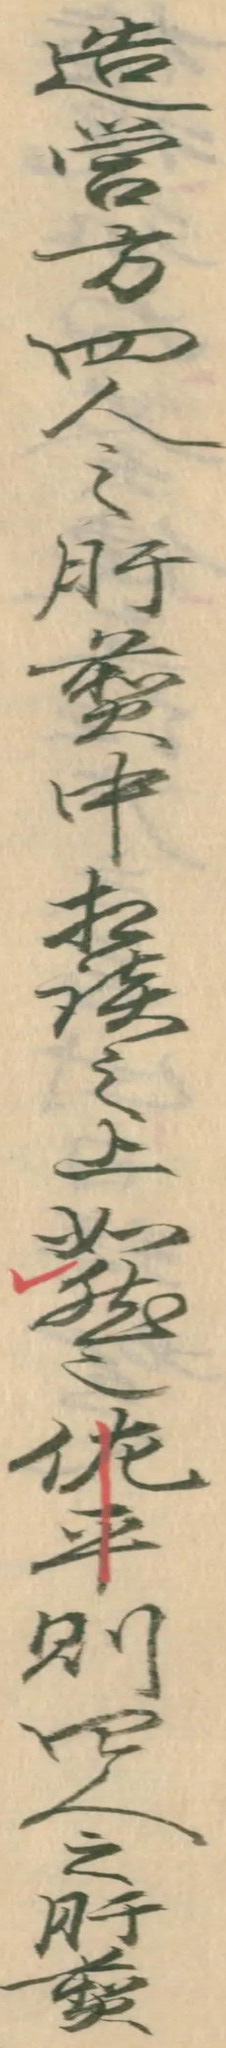造営方四人之肝煎中相談之上如然也佐平則四人之肝煎ニて
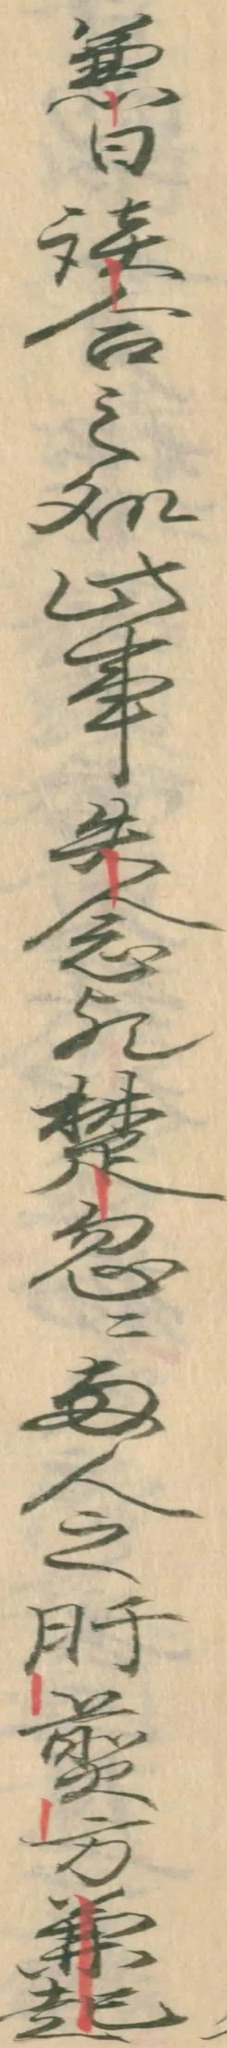兼-日談-合之処此事失-念歟楚-忽ニ両人之肝_煎_方兼起

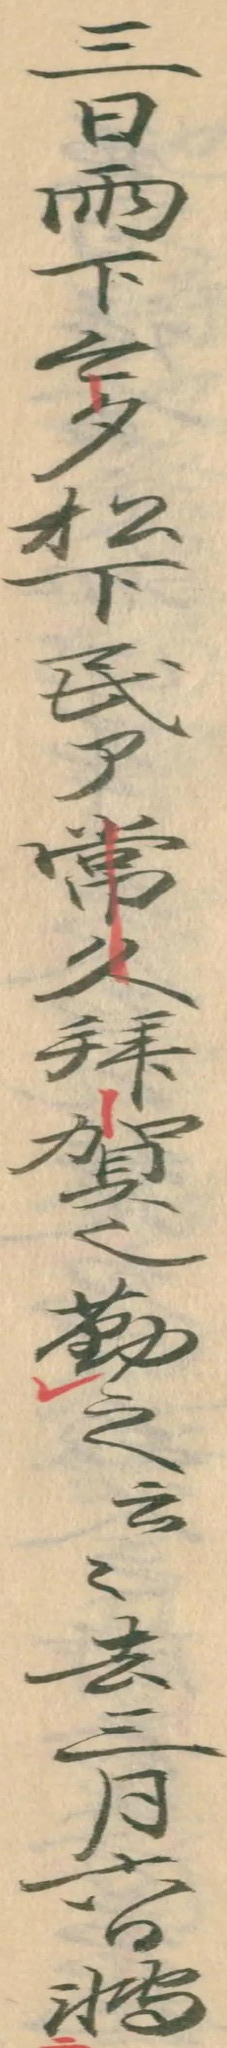三日雨下今-夕松下民部常久拝-賀也勤之云々去三月六日転
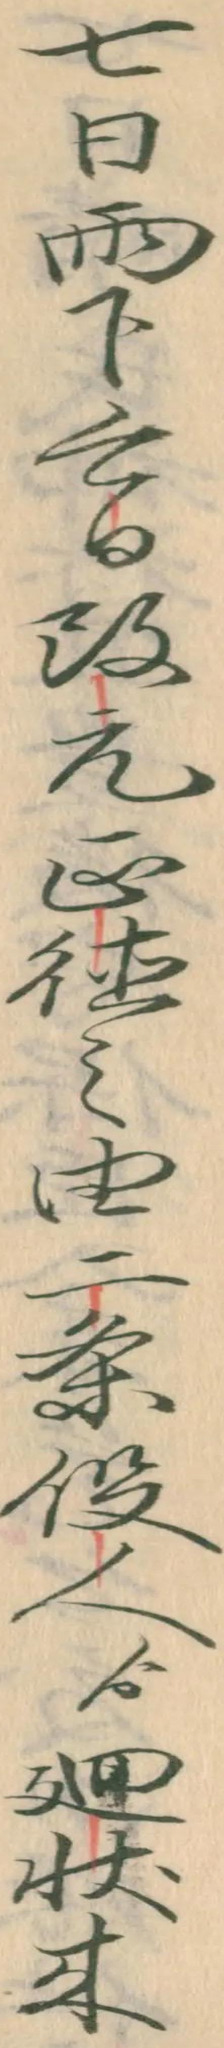七日雨下今-日改-元正-徳之由二-条役-人ゟ廻-状来
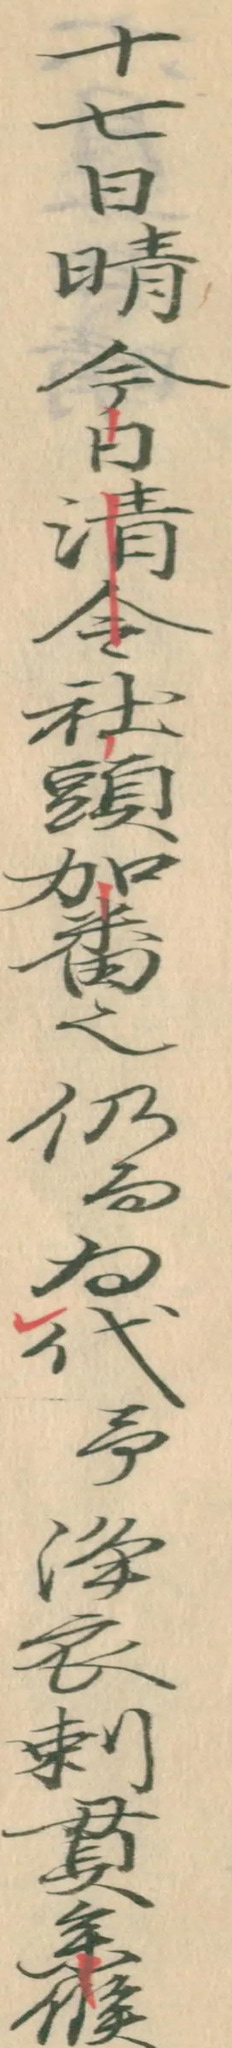十七日晴今-日清令社-頭加-番也仍而為代予浄衣刺貫参-候
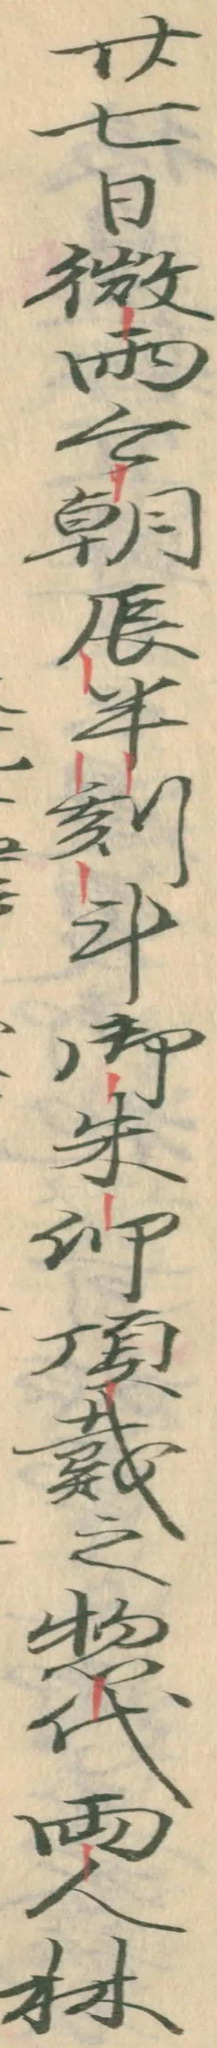廿七日微-雨今-朝辰_半_刻_計御-朱-印頂-戴之惣-代両-人林
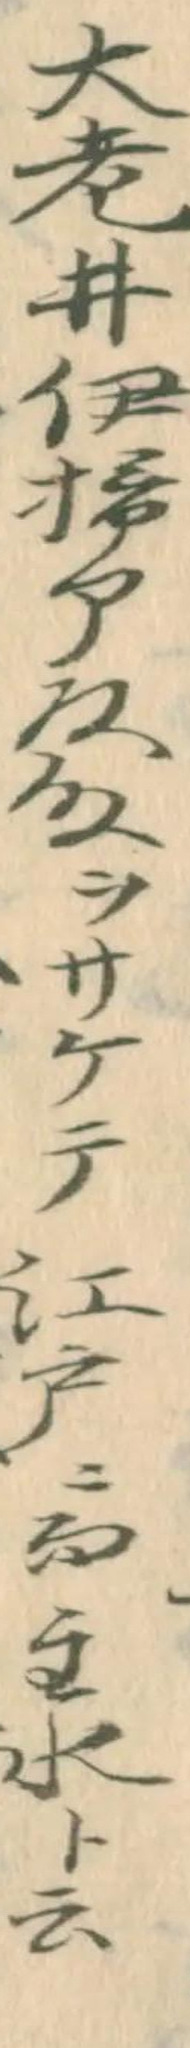大老井伊掃部頭殿ヲサケテ江戸ニ而主水ト云
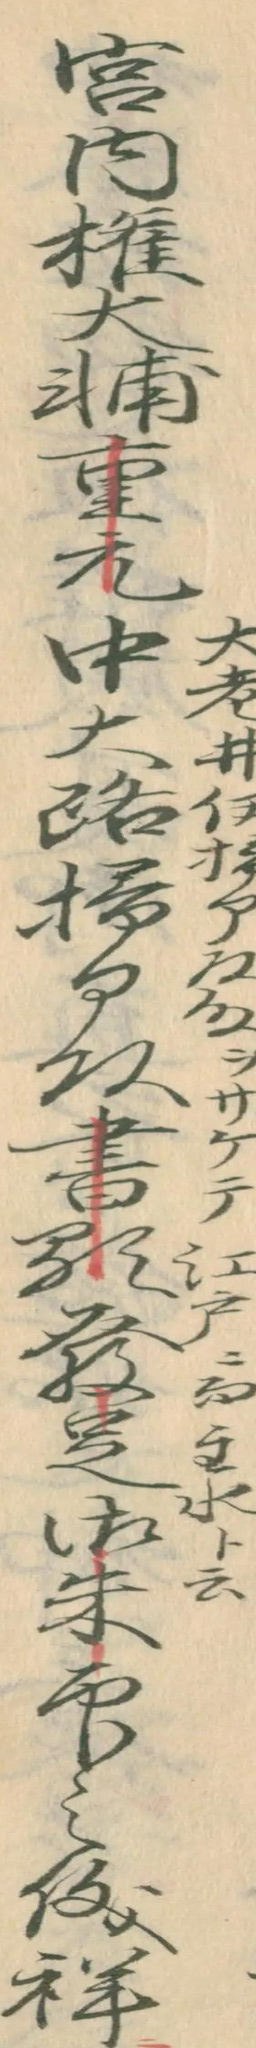宮内権大輔重元中大路掃部頭書顕発-足御-朱-印之儀祥

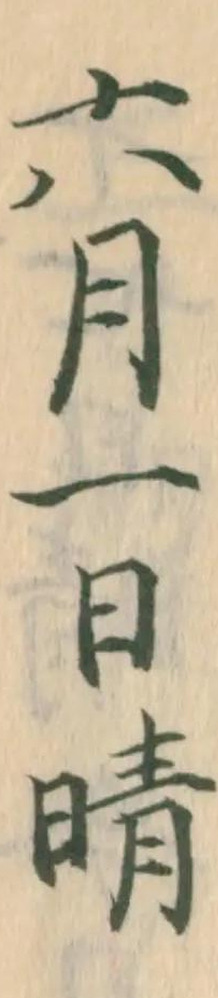六月一日晴
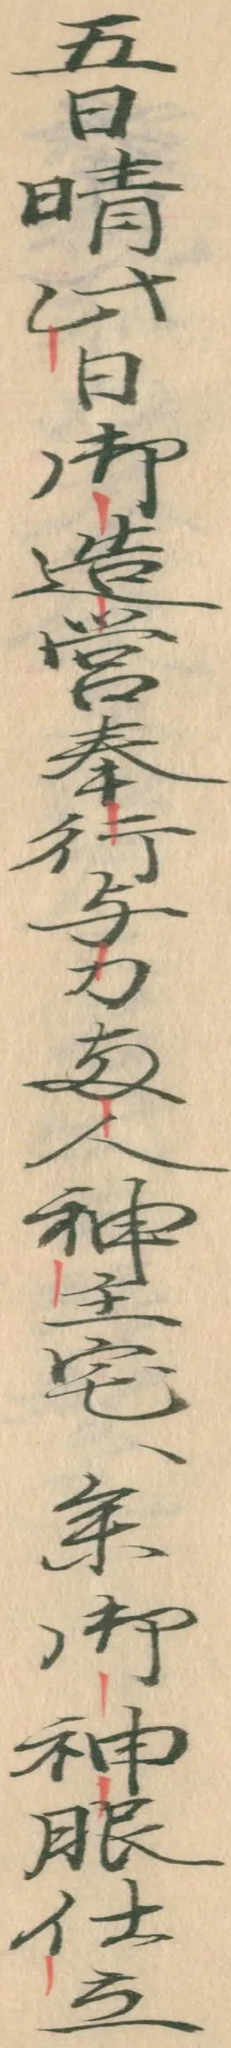五日晴此_日御-造-営奉-行与-力両-人神_主宅へ参御-神-服仕_立
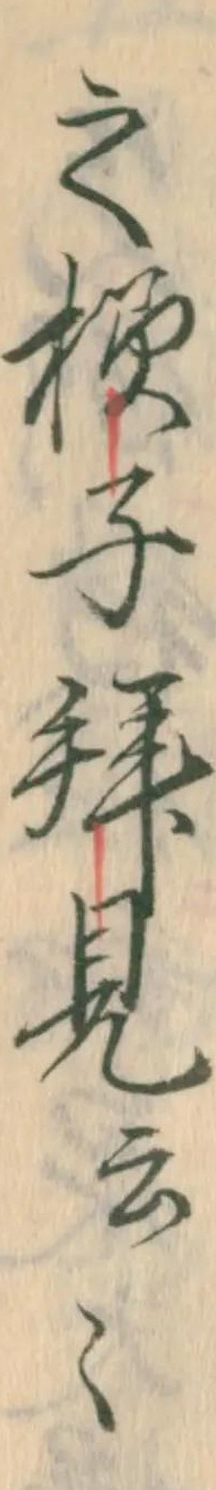之様-子拝-見云々
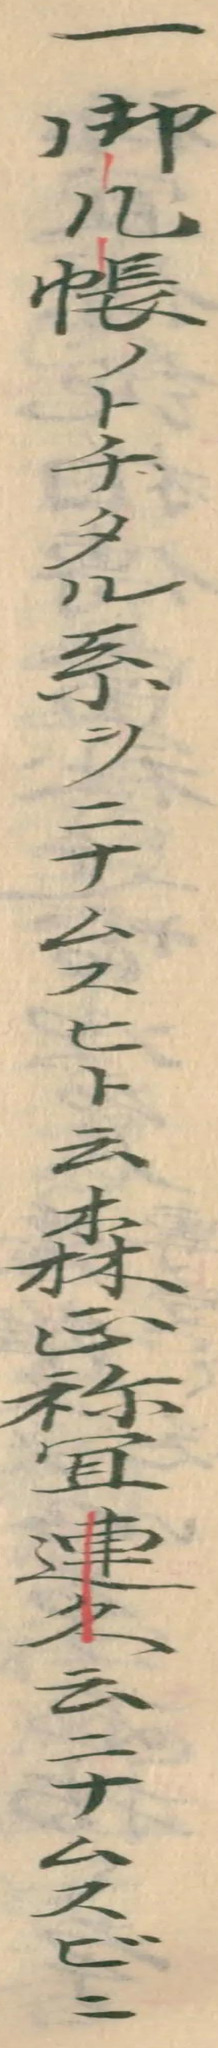一御-几-帳ノトチタル系ヲニナムスヒト云森正祢宜連久云ニナムスビニ
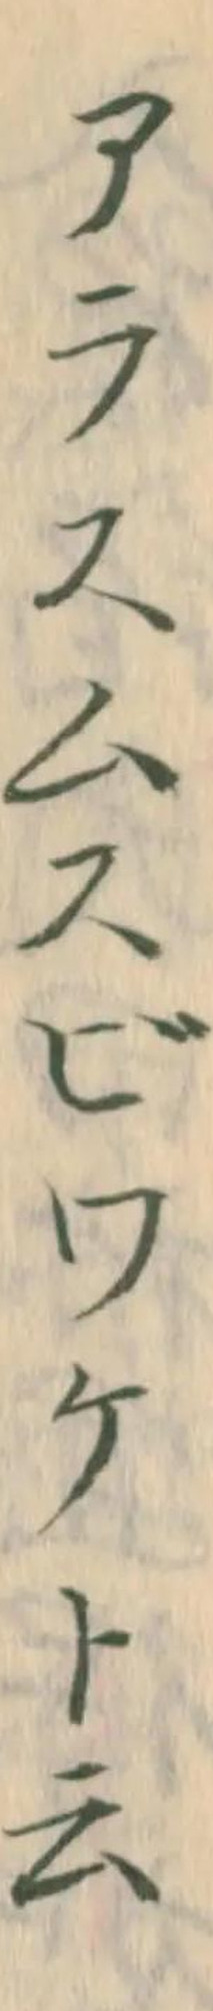アラスムスビワケト云
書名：賀茂社記録. 第15冊
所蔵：国立国会図書館 National Diet Library, JAPAN
